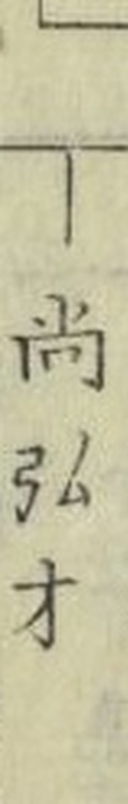尚弘才
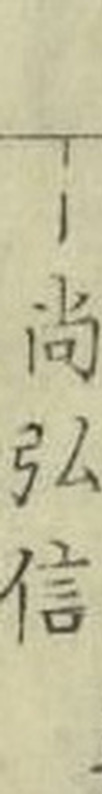尚弘信
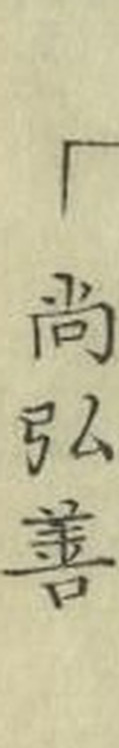尚弘善

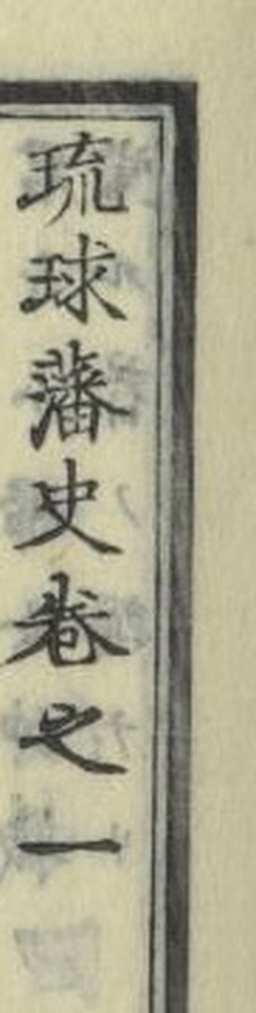琉球群史巻之一
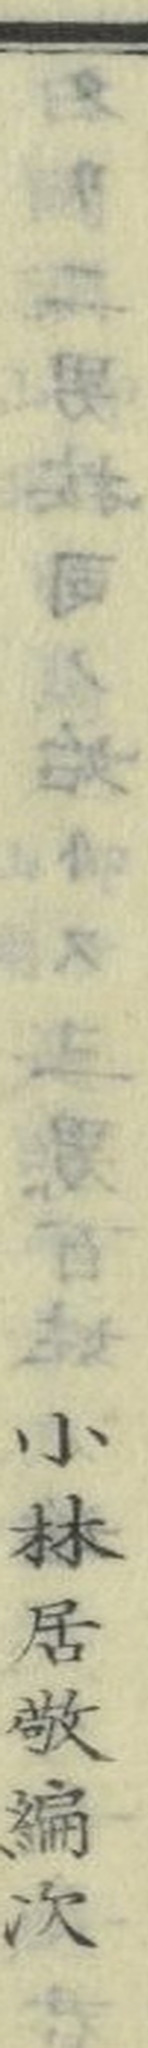小林居敬編次
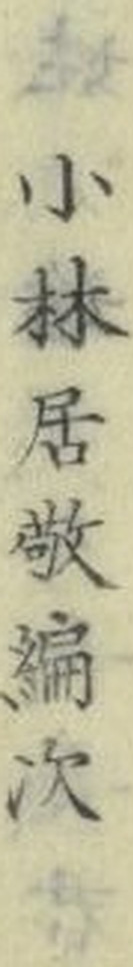小林居敬編次
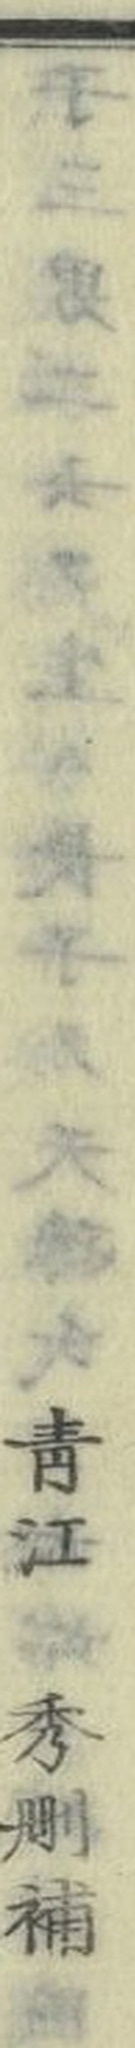靑江秀刪補
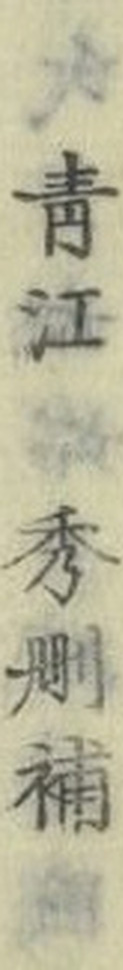靑江秀刪補
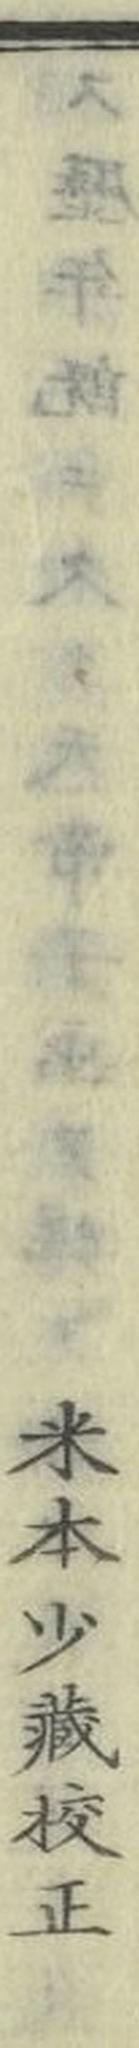米本少藏校正
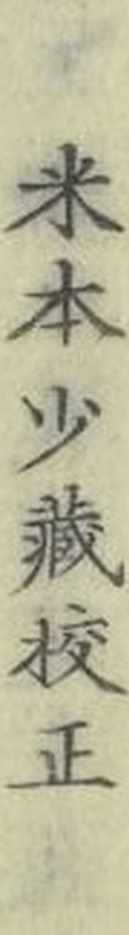米本少藏校正
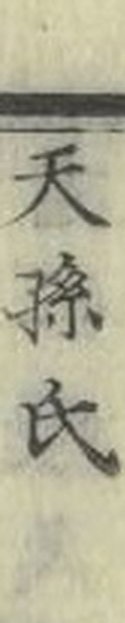天孫氏
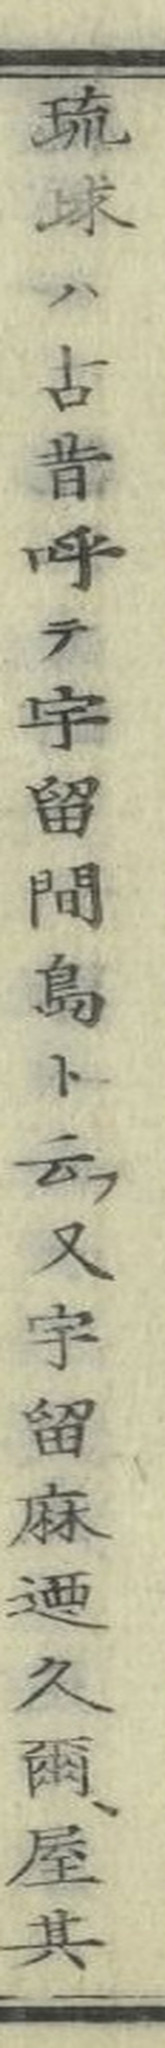琉球ハ古昔呼テ宇留間島ト云又宇留間迺久爾、屋其
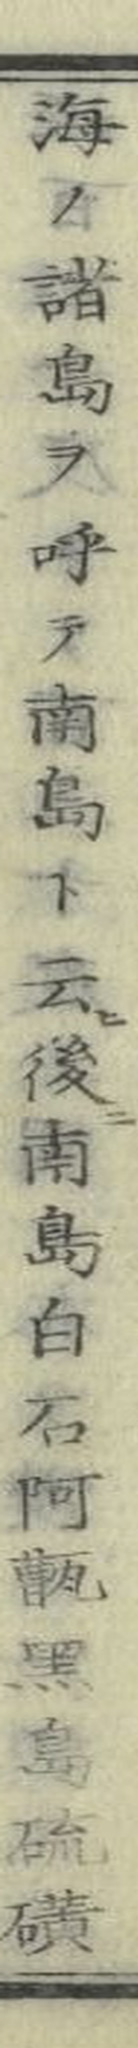海ノ諸島ヲ呼テ南島ト云後南島白石阿甑黑島硫礦
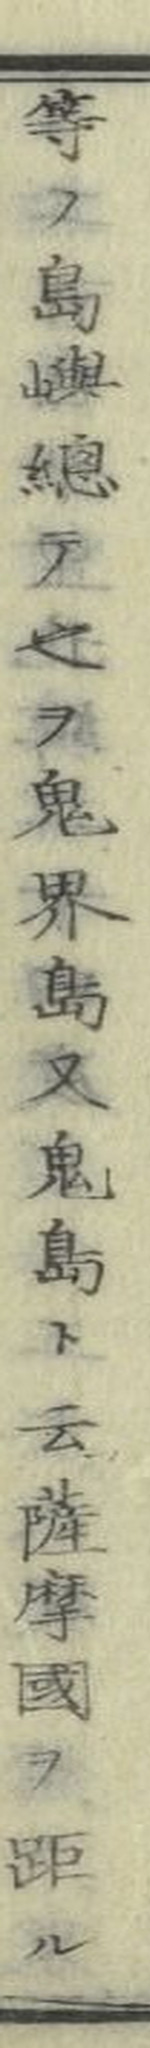等ノ島嶼總テ之ヲ鬼界島又魚島ト云薩摩國ヲ距ル

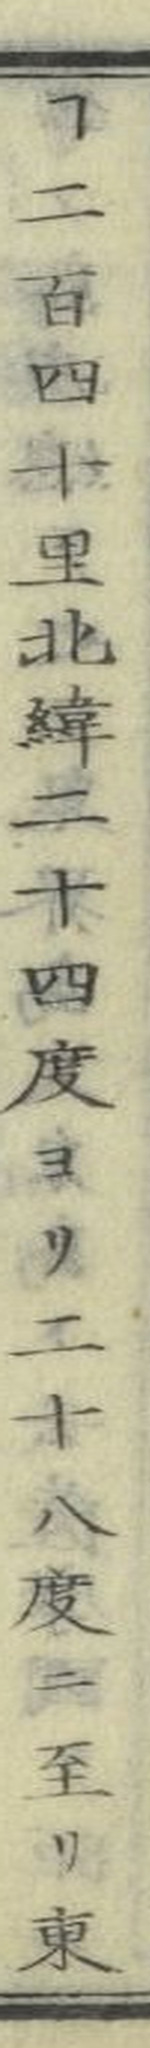コト二百四十里北緯二十四度ヨリ二十八度ニ至リ東
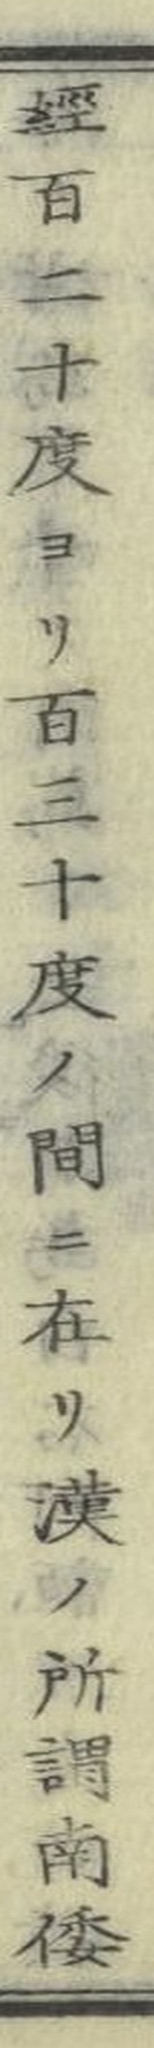經百二十度ヨリ百三十度ノ間ニ在リ漢ノ所謂南倭
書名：琉球藩史 一之巻
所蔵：University of the Ryukyus Library
